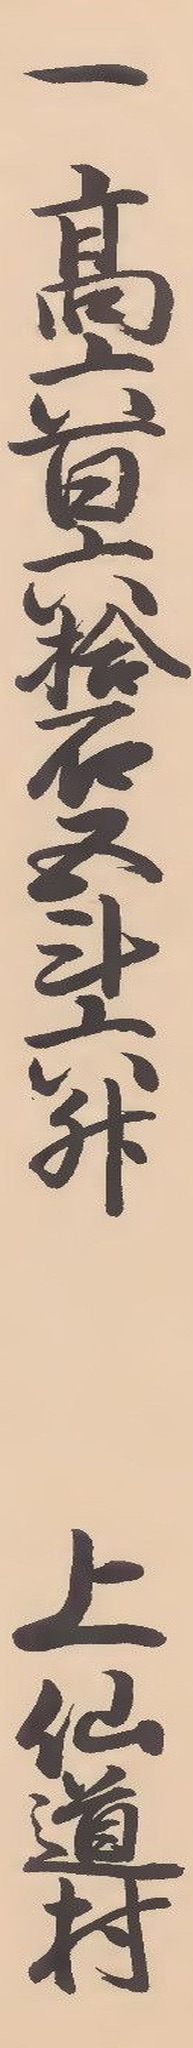一高六百六拾石五斗六升上仙道村
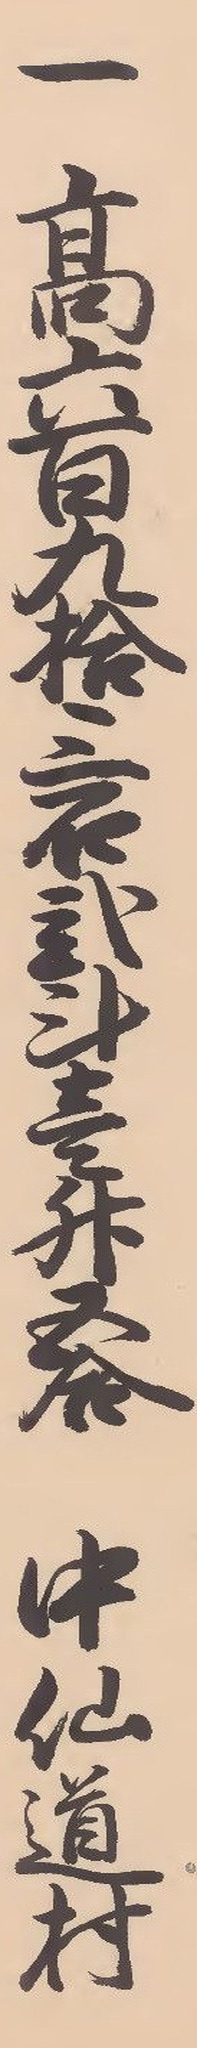一高六百九拾三石弐斗壱升五合中仙道村
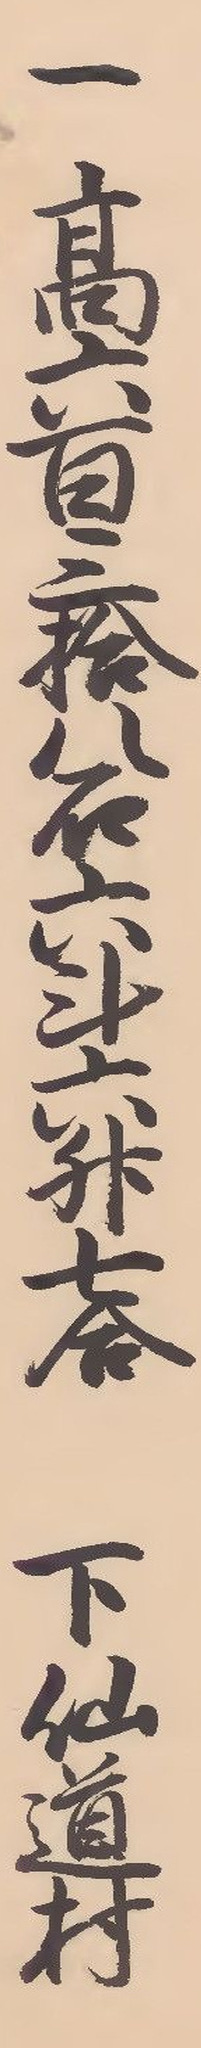一高六百三拾八石六斗六升七合下仙道村

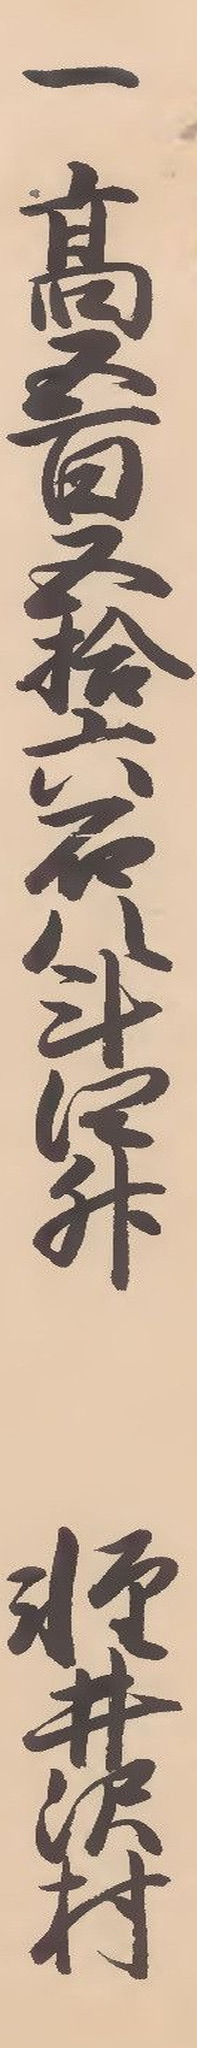一高五百五拾六石八斗四升軽井沢村
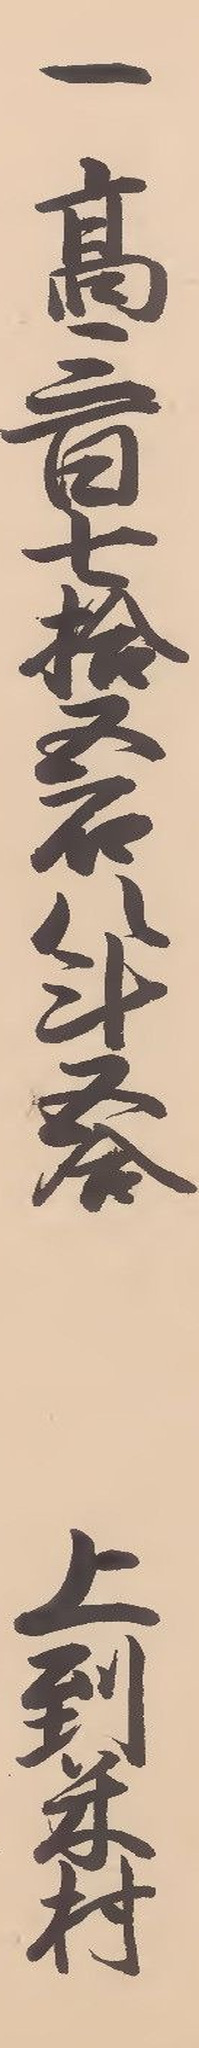一高三百七拾五石八斗五合上到米村
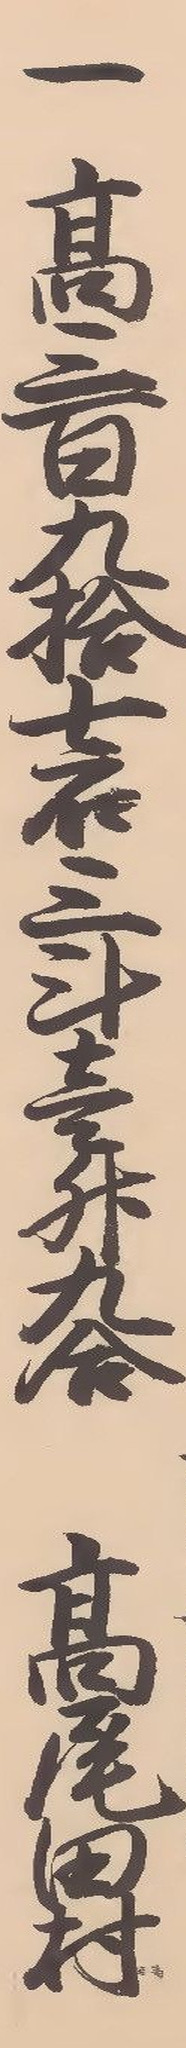一高三百九拾七石三斗壱升九合高尾田村
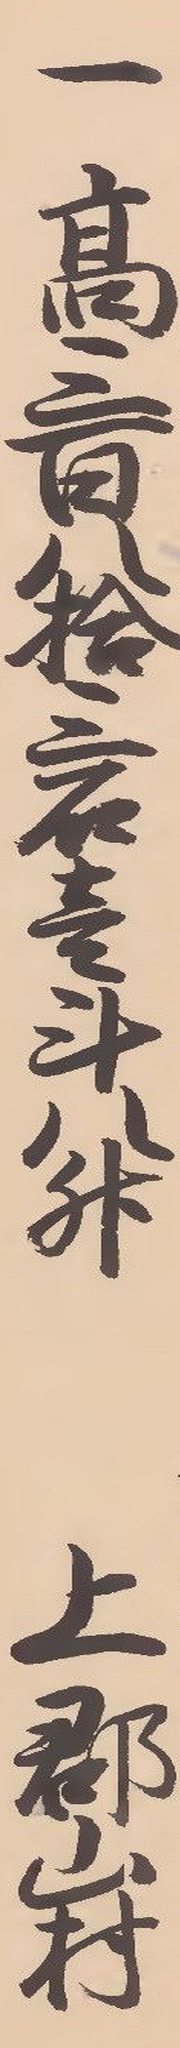一高三百八拾三石壱斗八升上郡山村
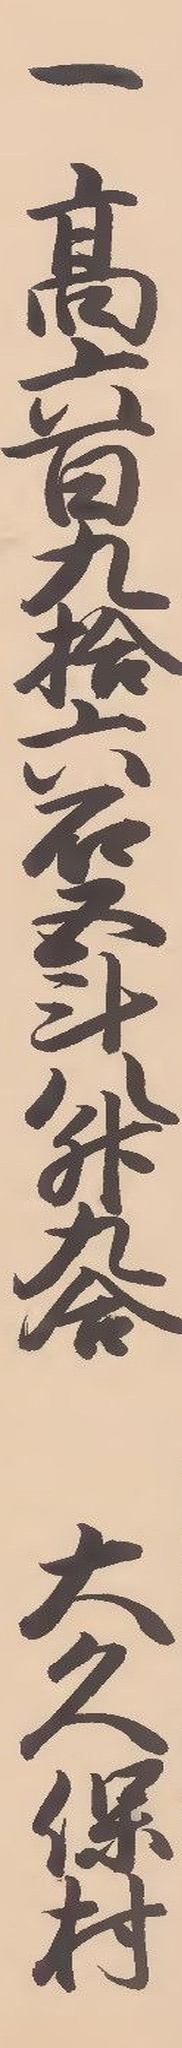一高六百九拾六石五斗八升九合大久保村
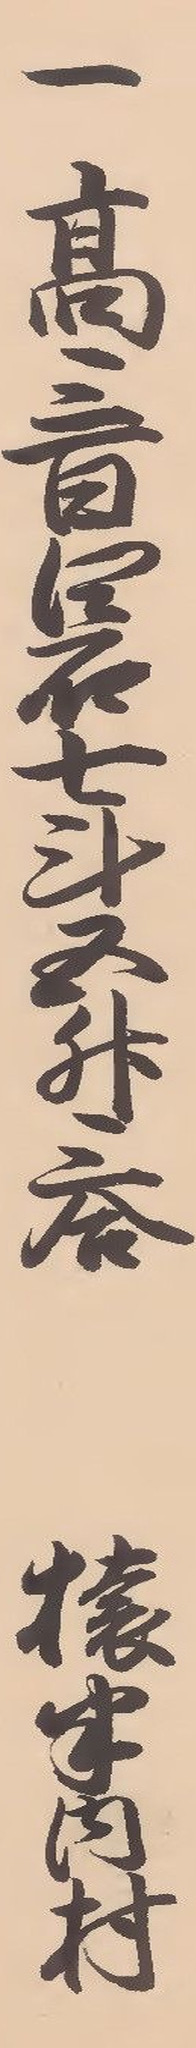一高三百四石七斗五升三合猿半内村
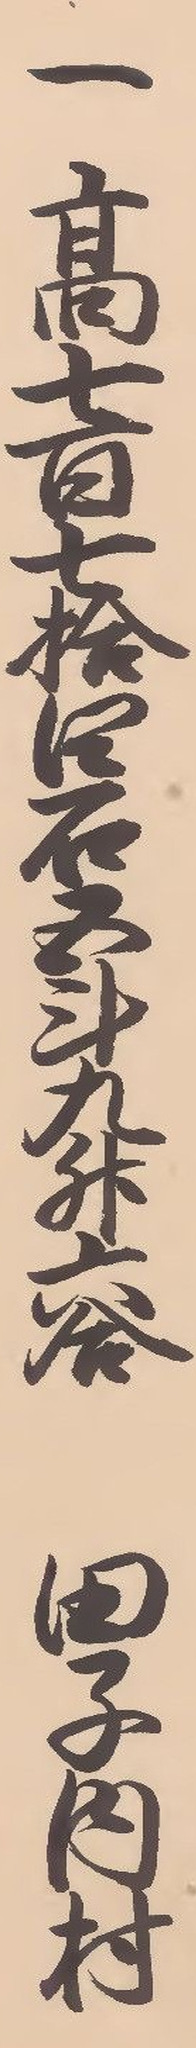一高七百七拾四石五斗九升六合田子内村
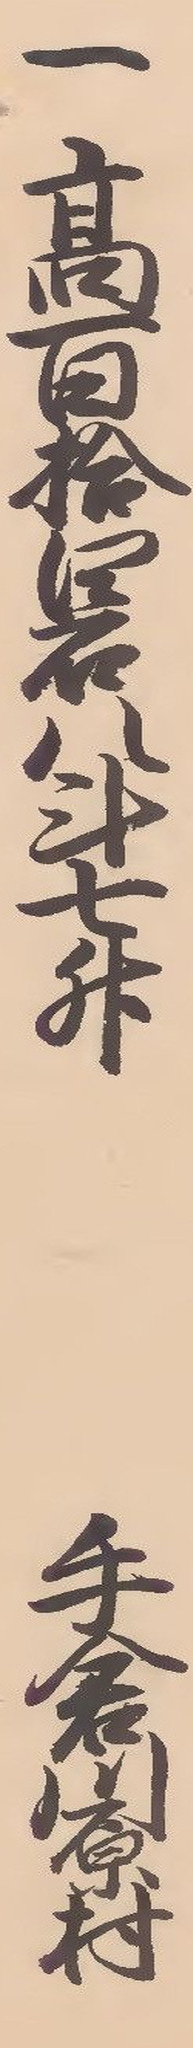一高百拾四石八斗七升手倉川原村

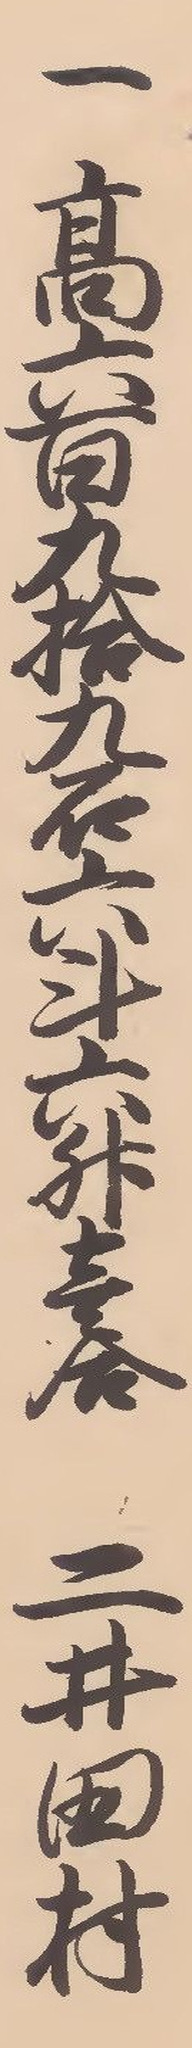一高六百九拾九石六斗六升壱合二井田村
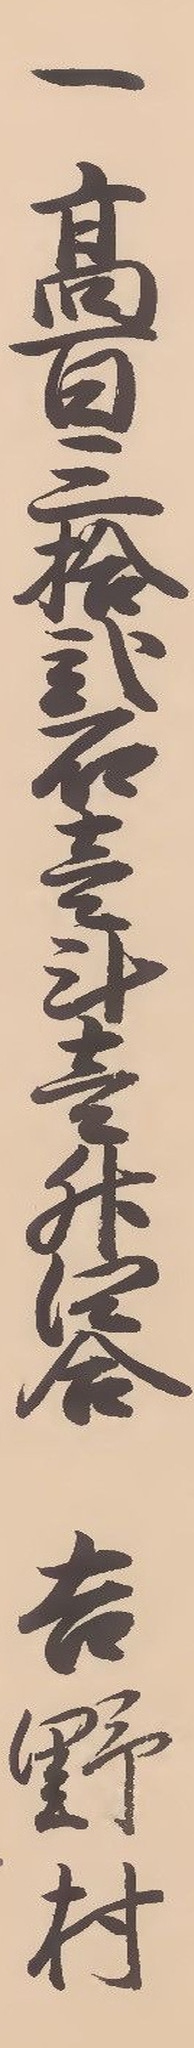一高百三拾弐石壱斗壱升四合吉野村
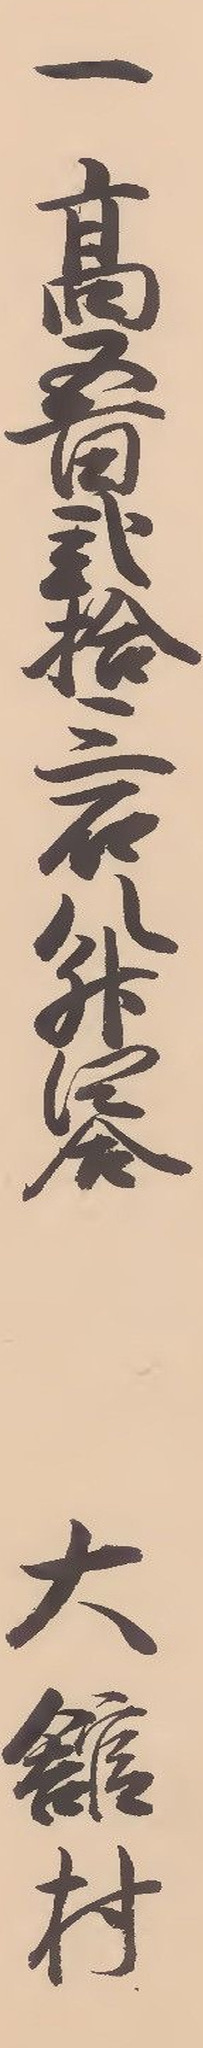一高五百弐拾三石八升四合大館村
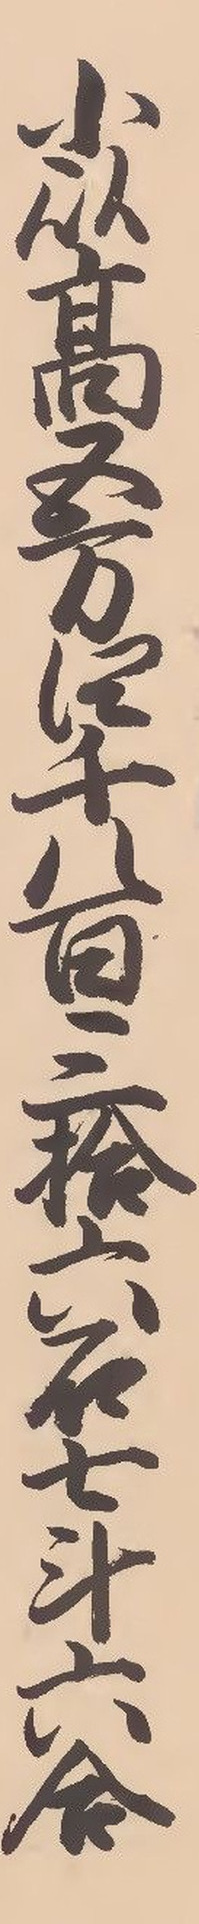小以高五万四千八百三拾六石七斗六合

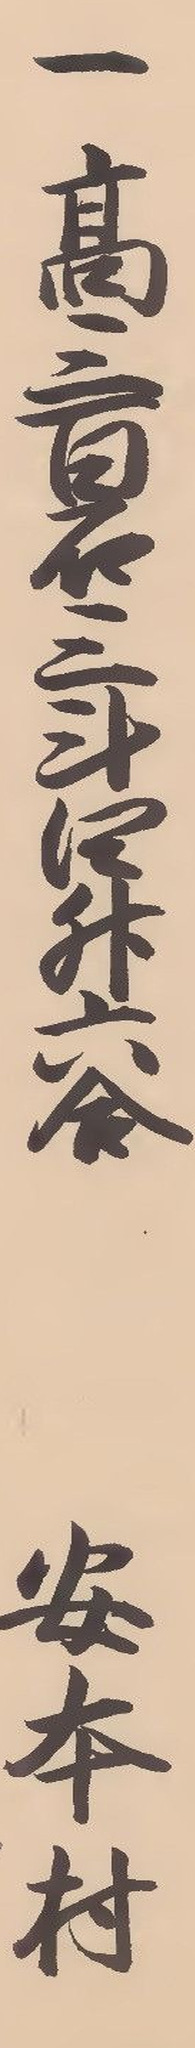一高三百石三斗四升六合安本村
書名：出羽国郷帳　５
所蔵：国立公文書館 National Archives of Japan
